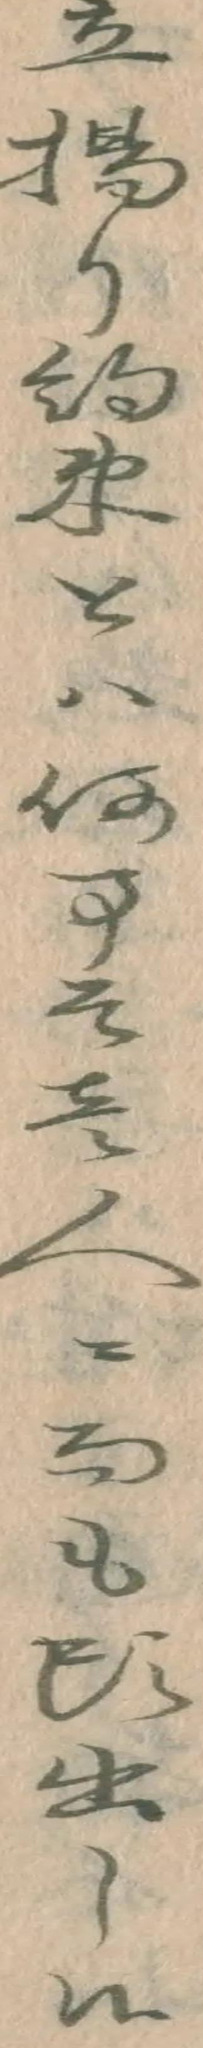立揚り約束とは何事そ壱人に而も頭出し候
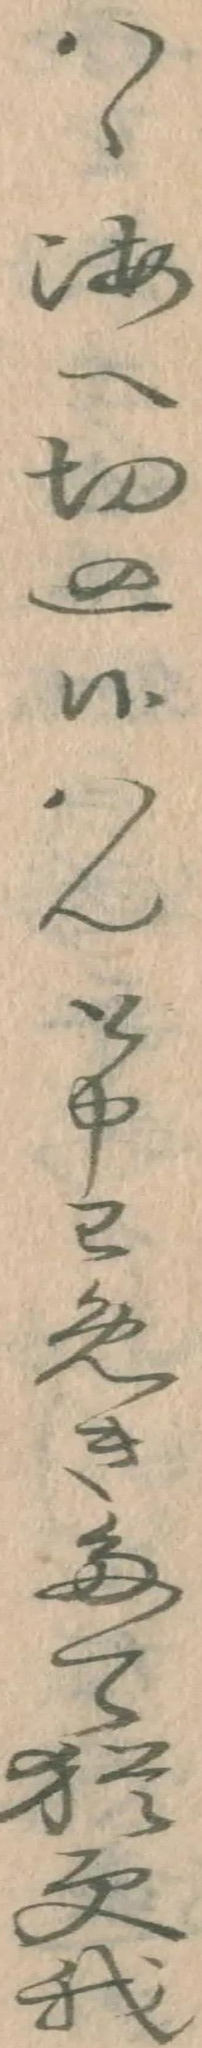はゝ海へ切込候はんと申已免き多て猶更我

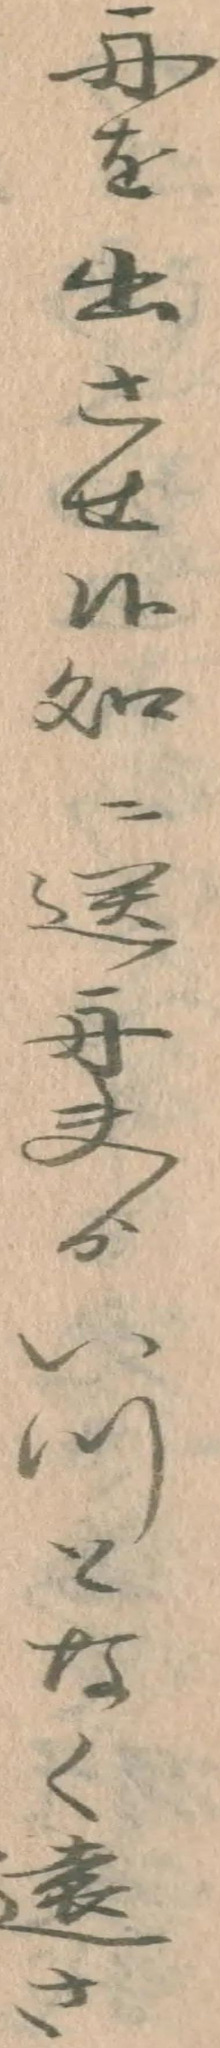舟を出させ候処に送舟夫ゟい川となく遠き
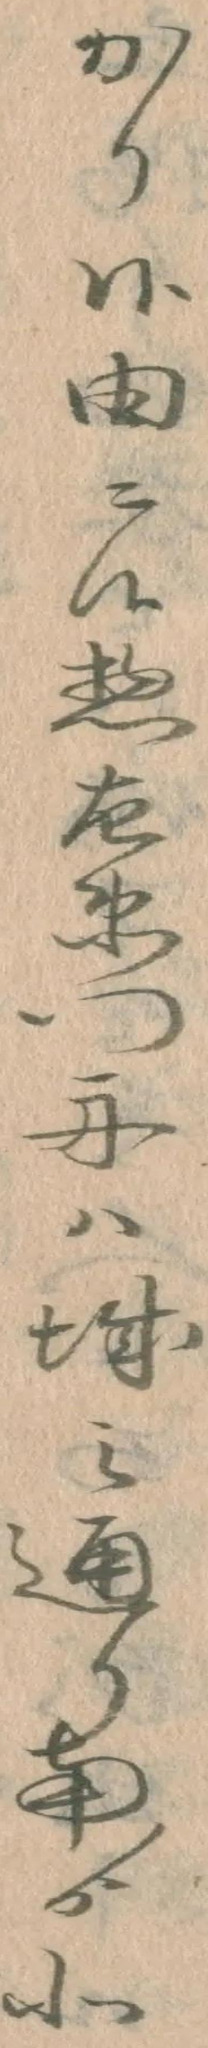かり候由に候惣左衛門舟は城之通り南ゟ北
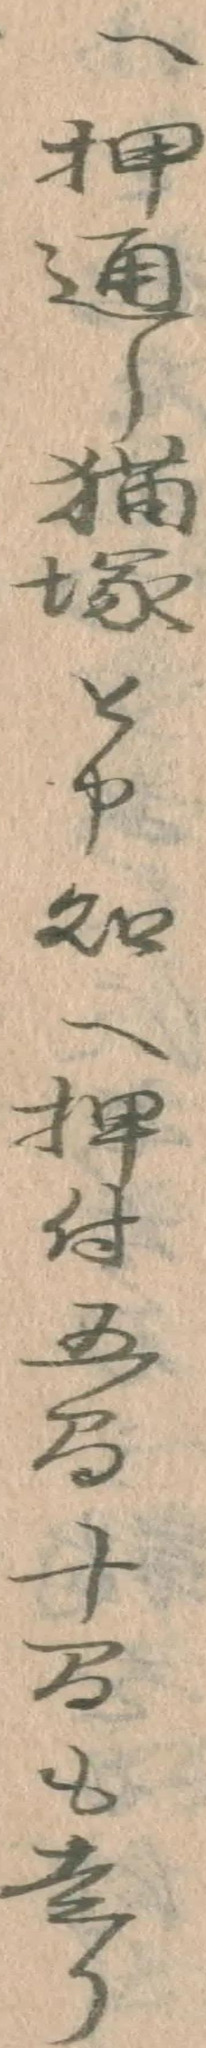へ押通し猶塚と申処へ押付五間十間も走り
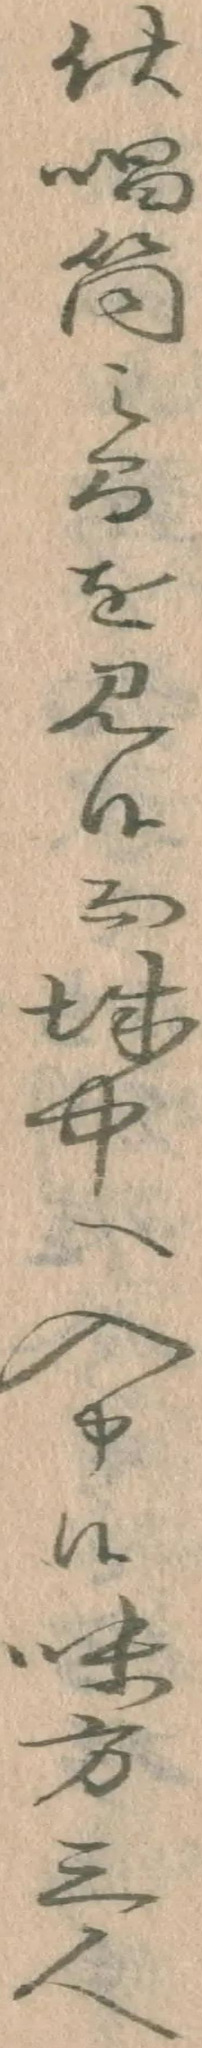伏唱筒之間を見候而城中へ入申候味方三人
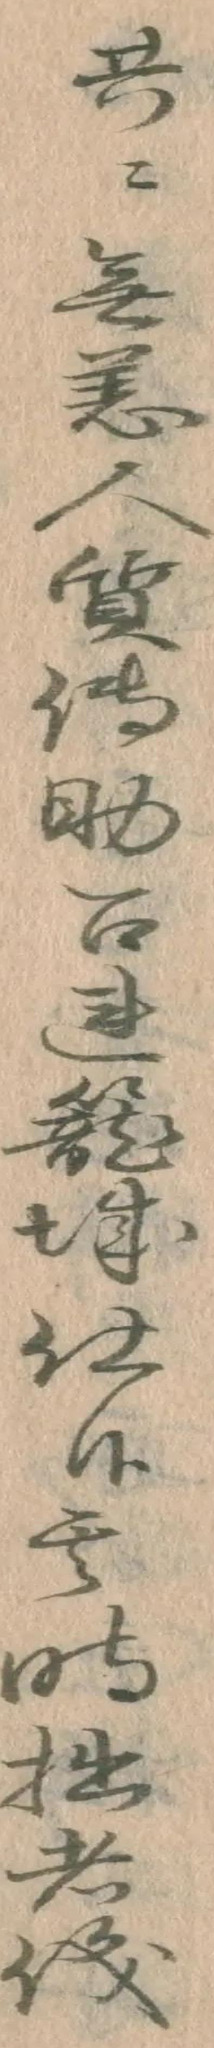共に無恙人質伝助召連籠城仕候其時拙者儀
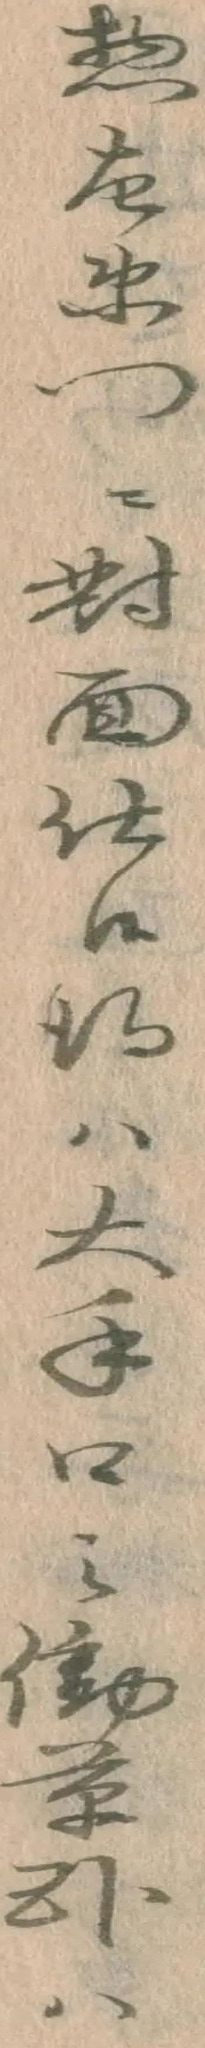惣左衛門に対面仕候得は大手口之働草臥は
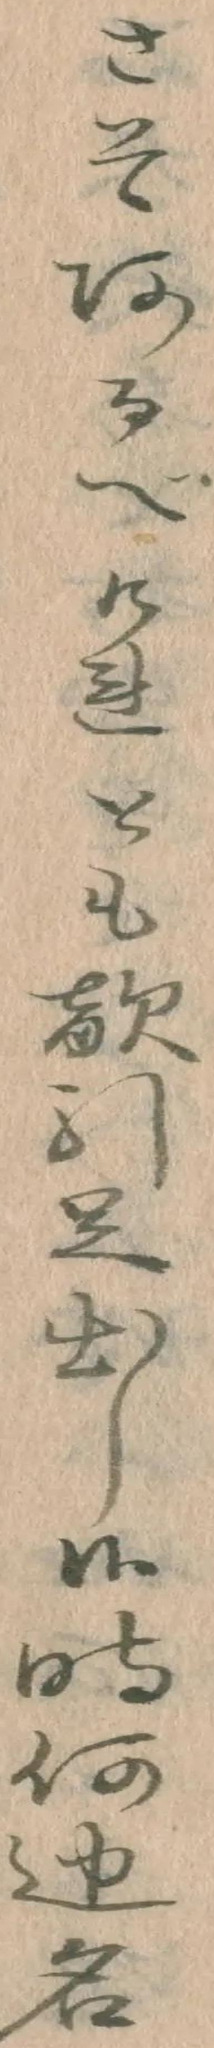さそ阿るべけ連とも敵引足出し候時何迚名
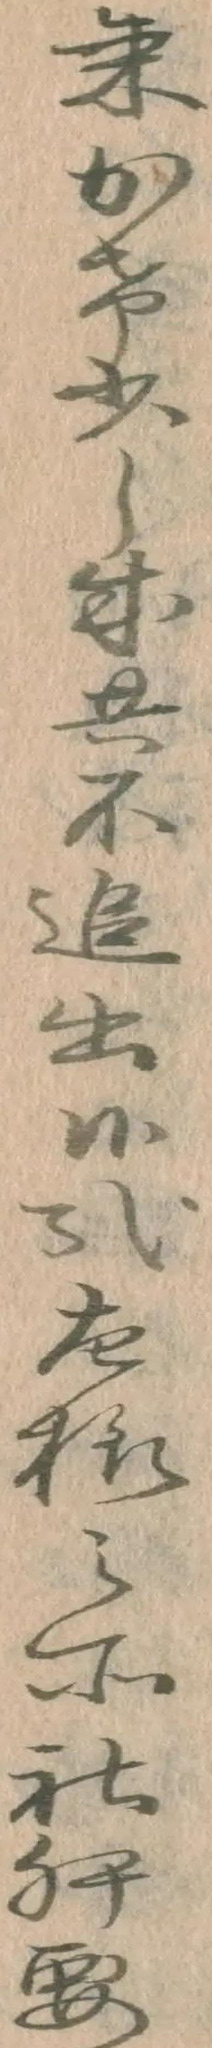栄か希少し成共不追出候哉左様之所社肝要
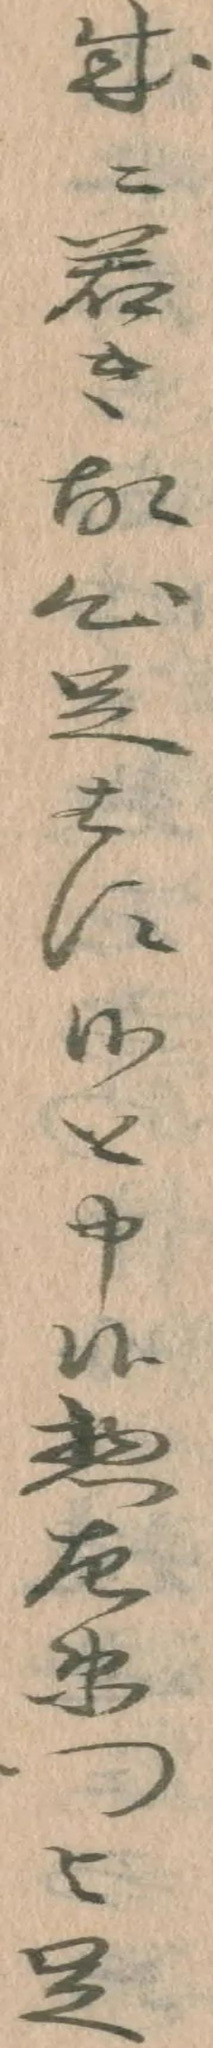成に若き故心足者須候と申候惣左衛門与足
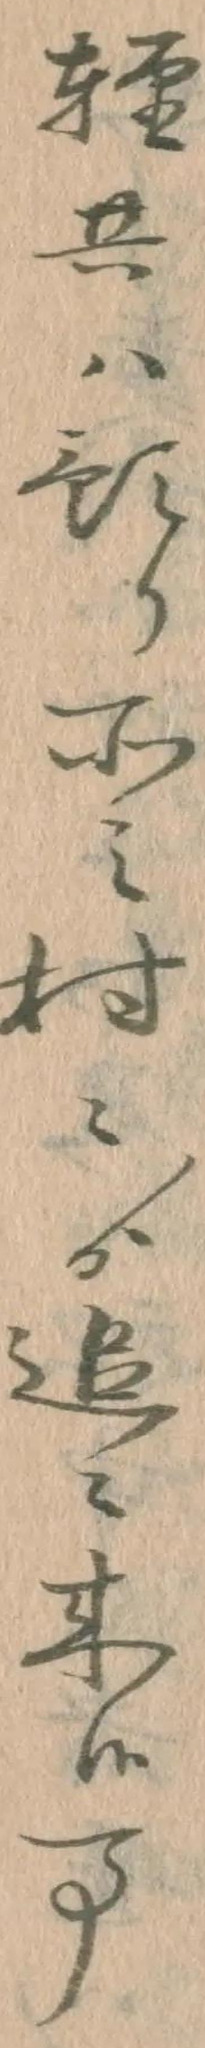軽共は預り所之村々ゟ追々来候事
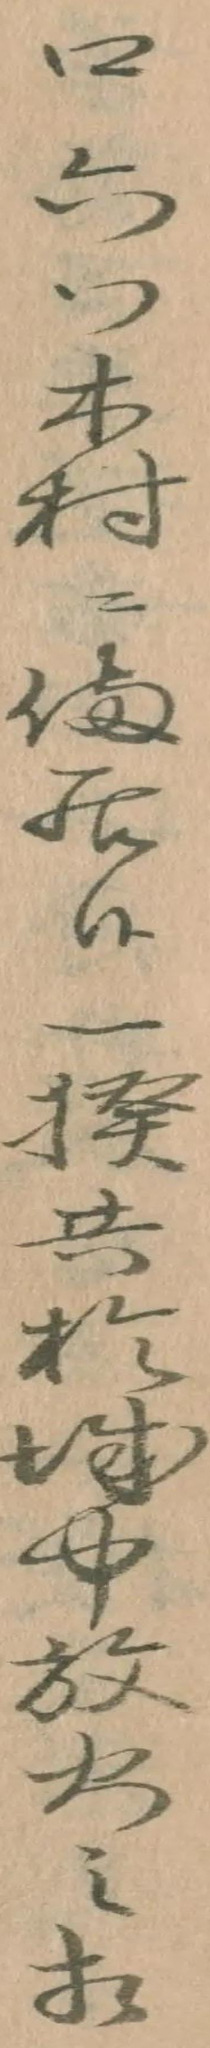口六つ木村に備居候一揆共於城中放火之相
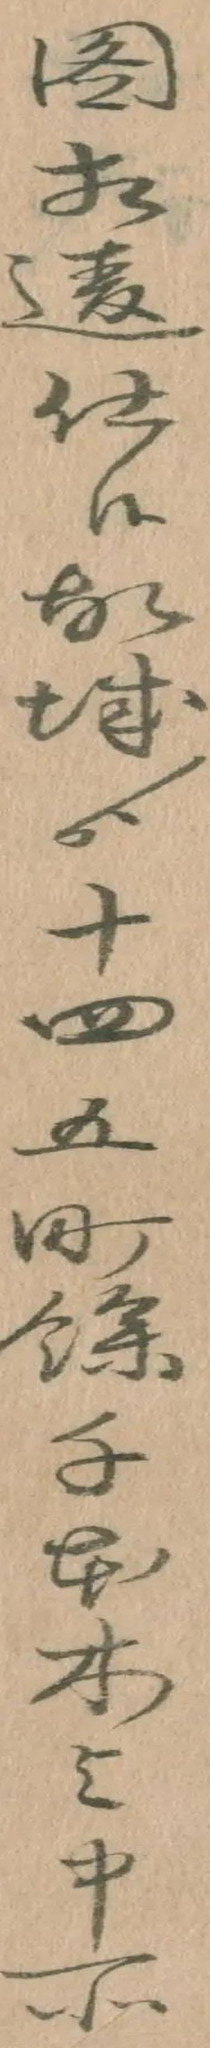閣相違仕候故城ゟ十四五町余千本木与申所
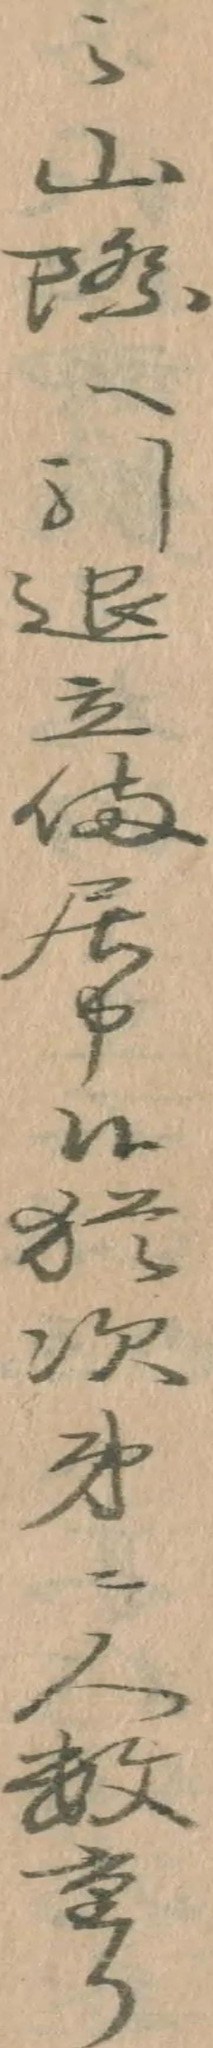之山際へ引退立備居申候猶次第に人数重り
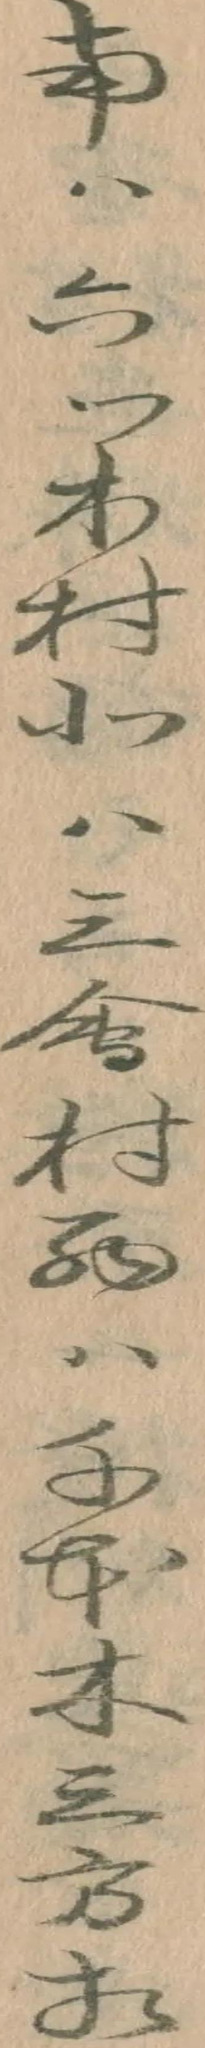南は六つ木村北は三会村西は千本木三方相
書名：切支丹御退治記 49巻. [2]
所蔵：国立国会図書館 National Diet Library, JAPAN
